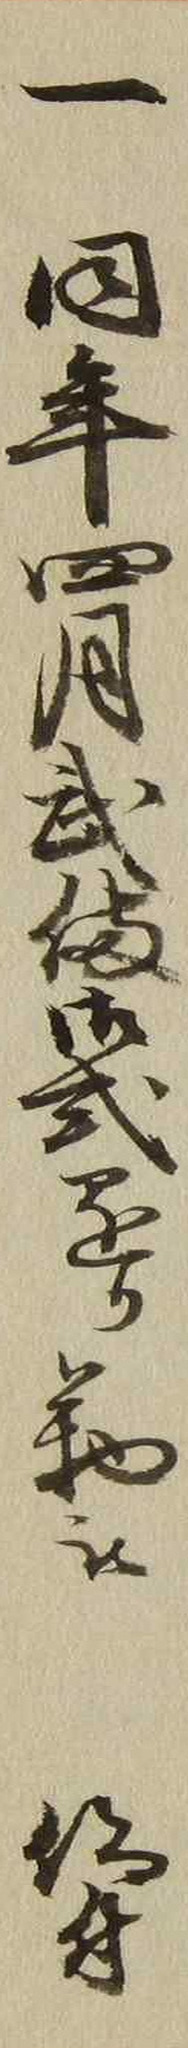一同年四月武備御式懸り勤被仰付
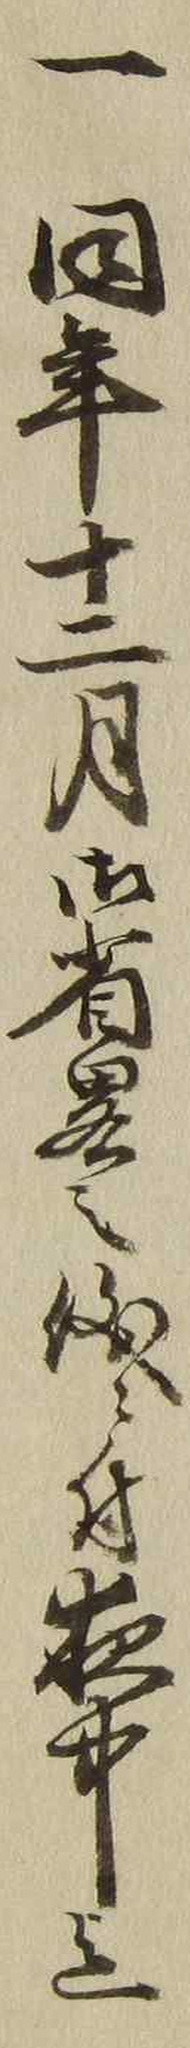一同年十二月御省略之儀ニ付夜中迄

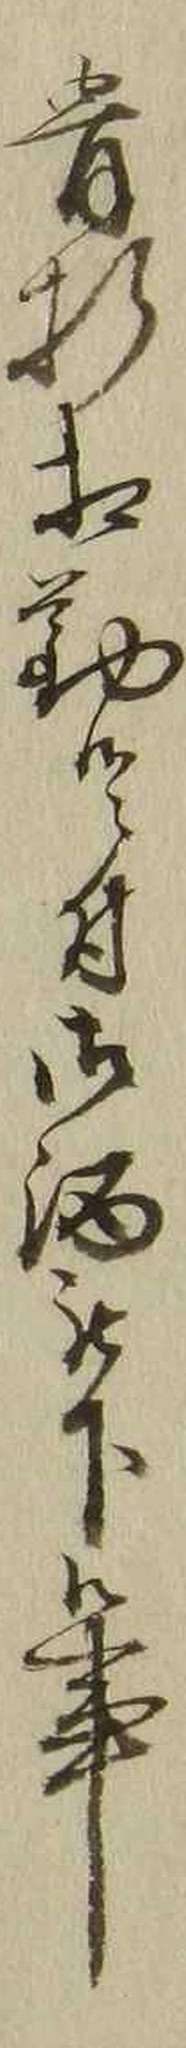骨折相勤候ニ付御酒被下置候事
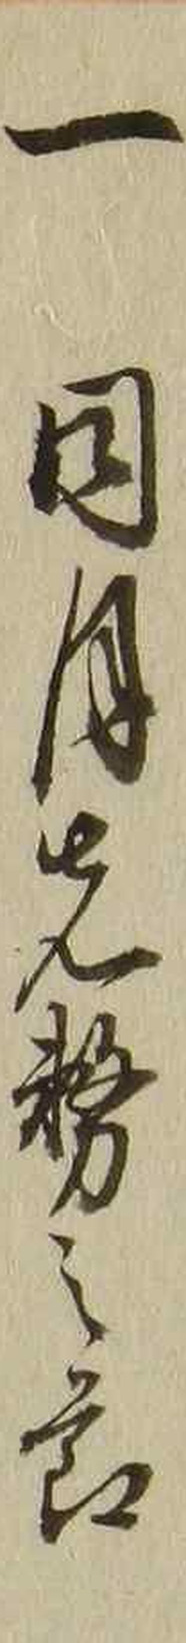一同月先務之節
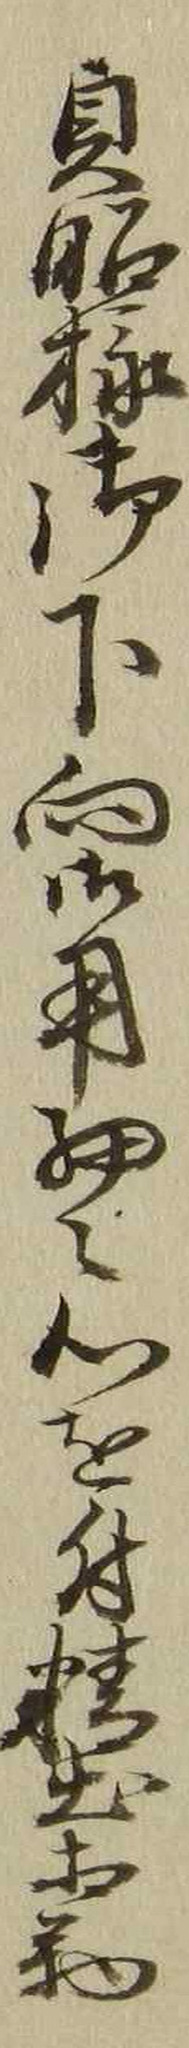貞昭様御御下向御用細々心を付精出相勤
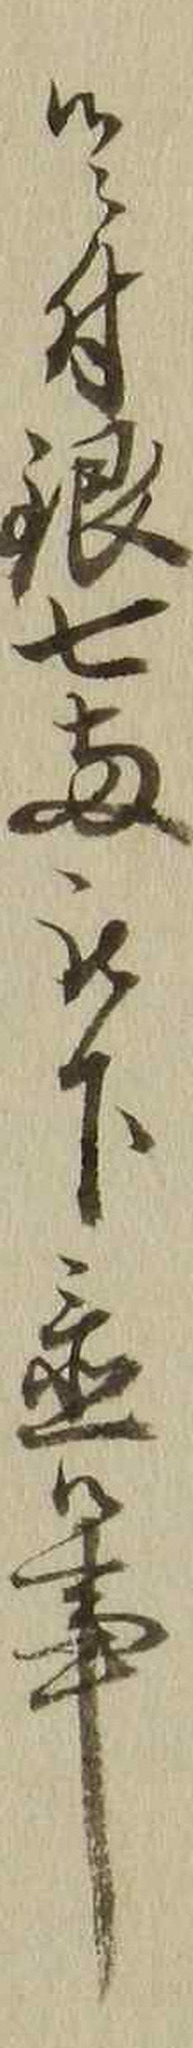候ニ付銀七両被下置候事
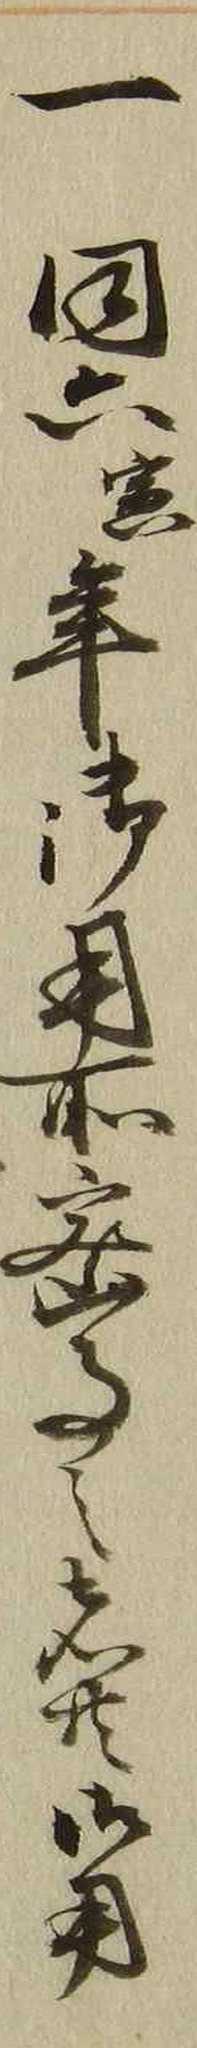一同六寅年御用所密事之者共御用
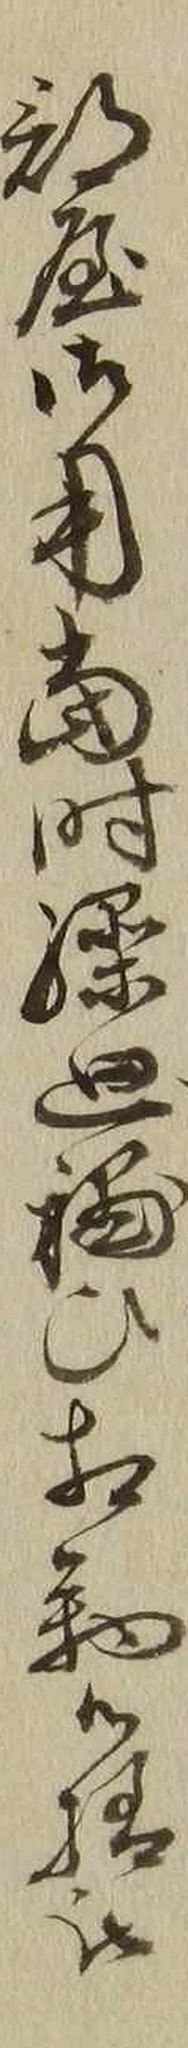部屋御用当時繰廻補ひ相勤候様被
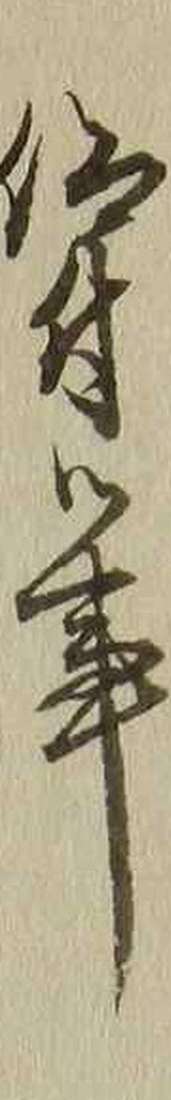仰付候事
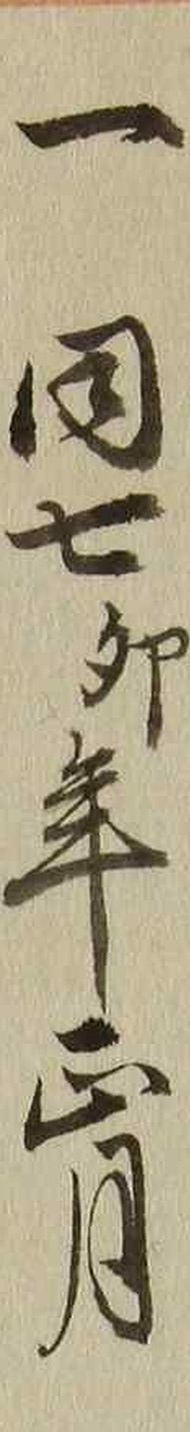一同七卯年正月
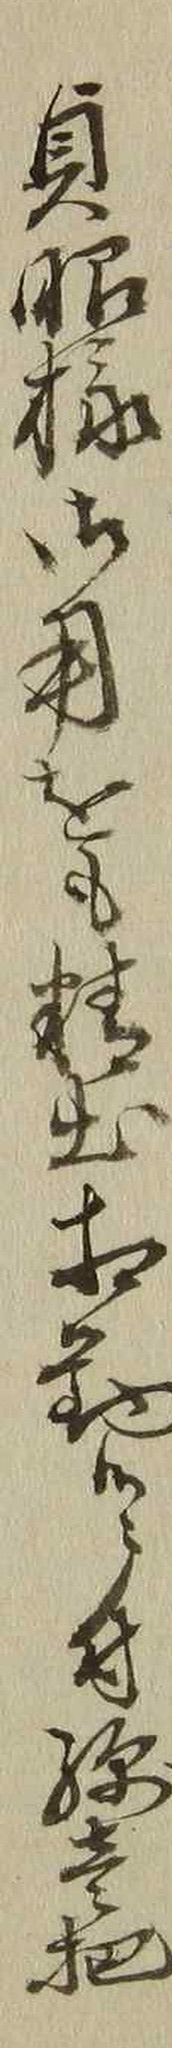貞昭様御用をも精出相勤候ニ付綿壱把
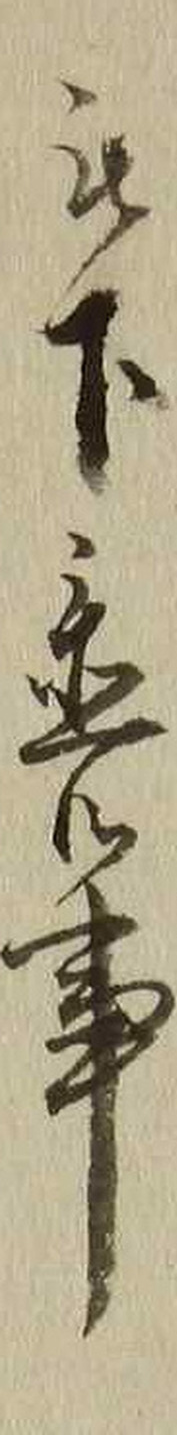被下置候事
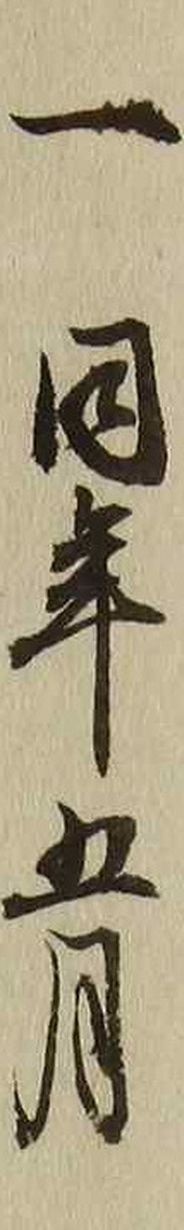一同年五月
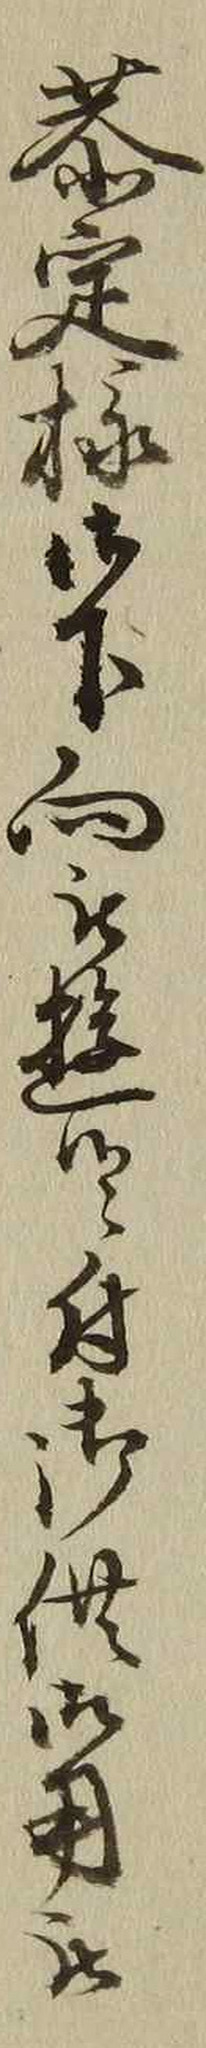恭定様御下向被遊候ニ付御供御用被
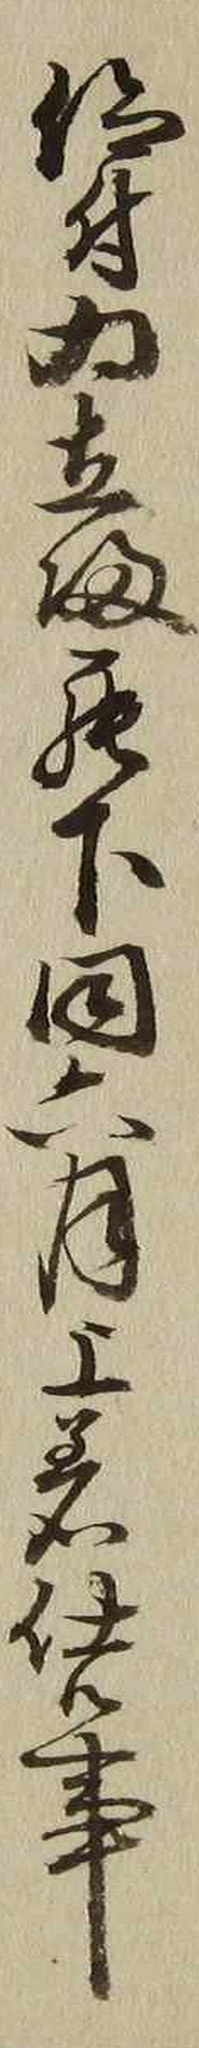仰付為立帰罷下同六月上着仕候事
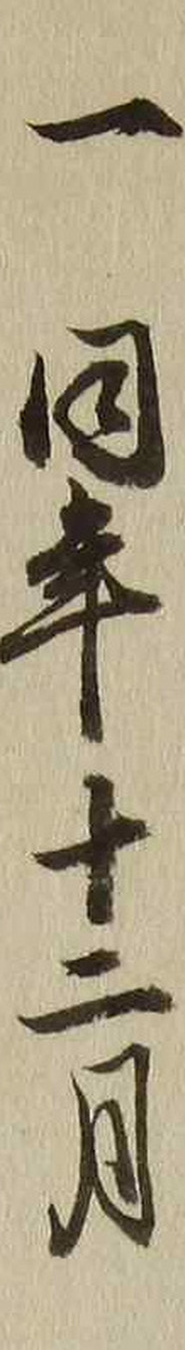一同年十二月
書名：諸士系譜　巻之64　と之部7
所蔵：会津若松市立会津図書館
